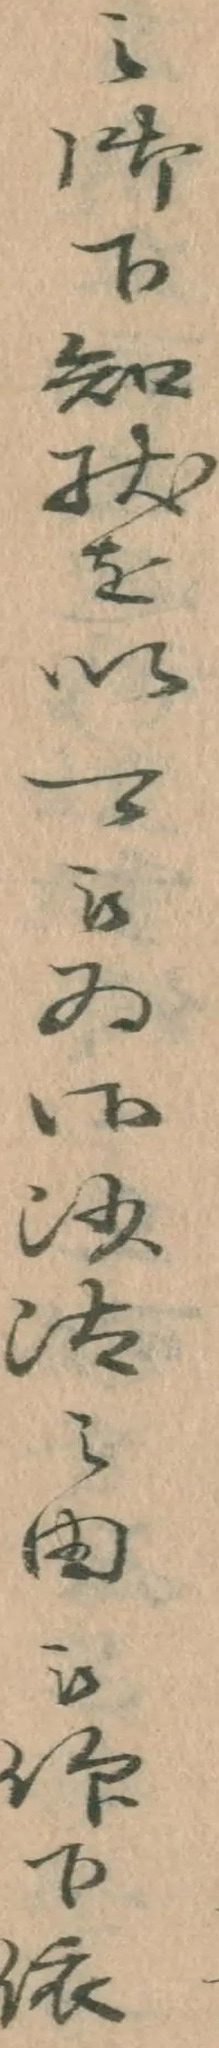之御下知状を以可被為御沙汰之由被仰下依
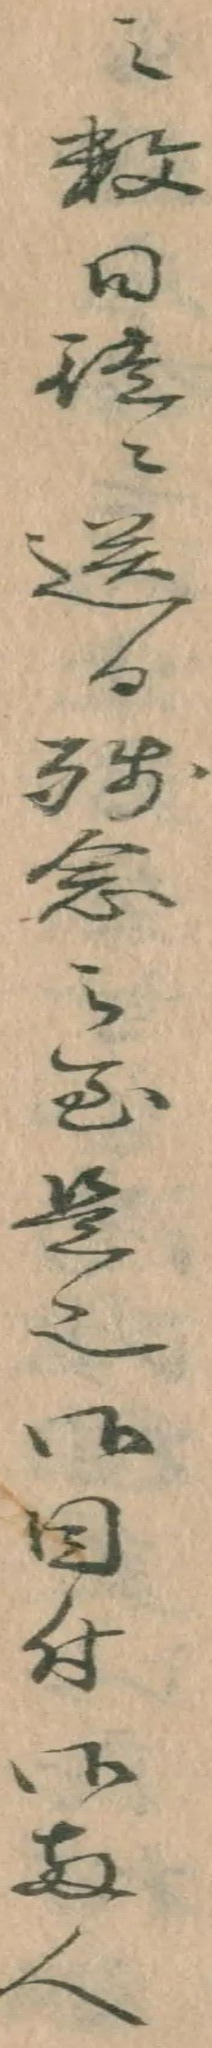之数日徒に送る残念之至是也御目付御両人
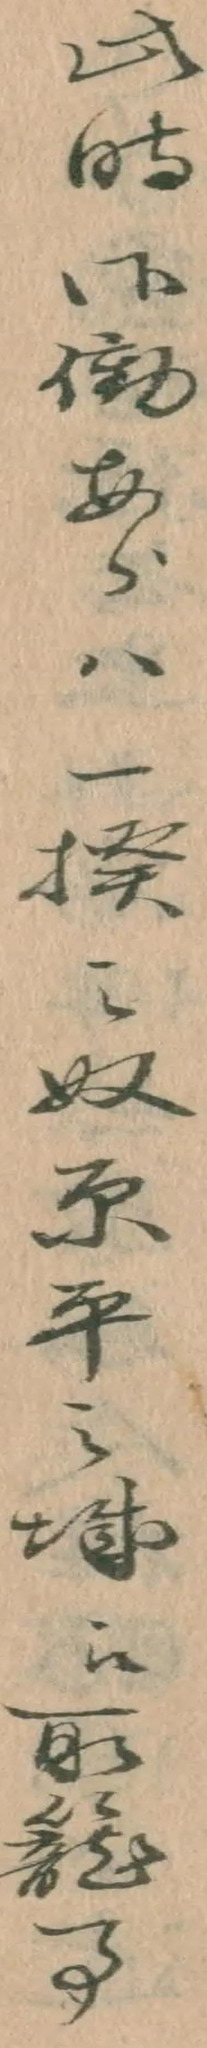此時御働あらは一揆之奴原平之城え取籠事
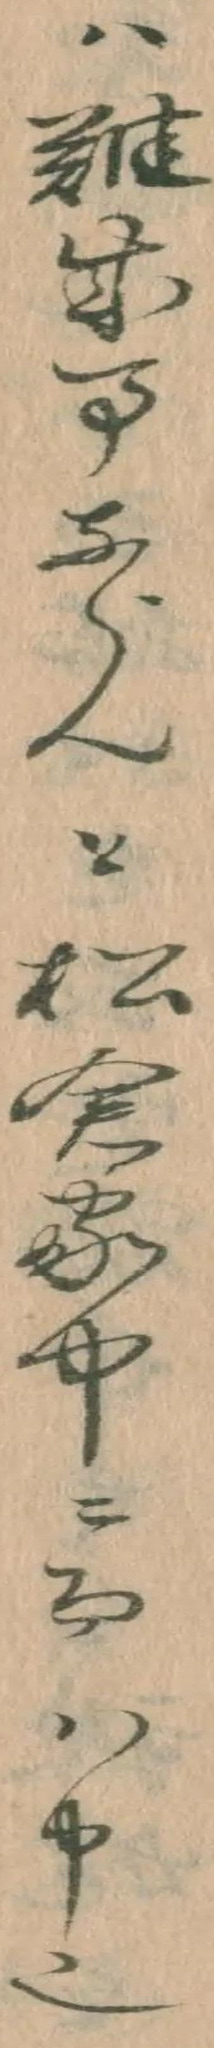は難成事ならんと松倉家中に而は申也
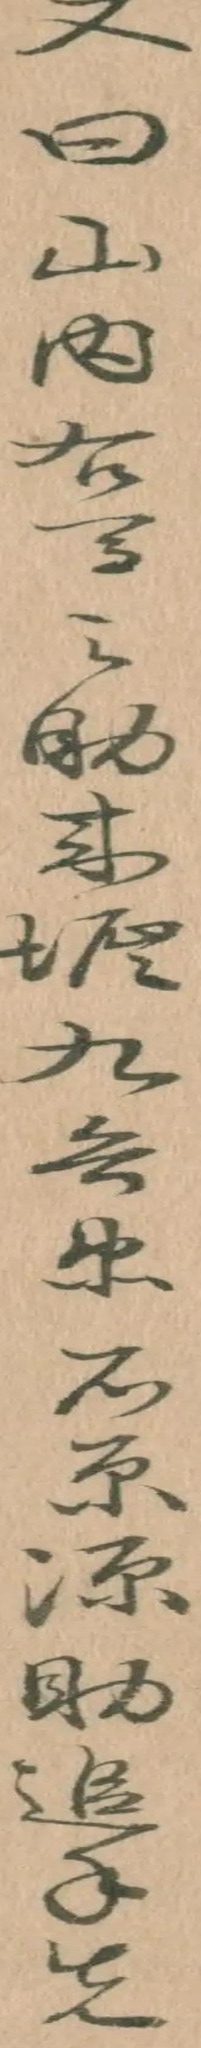又日山内有馬之助来堀九兵衛石原源助追手先
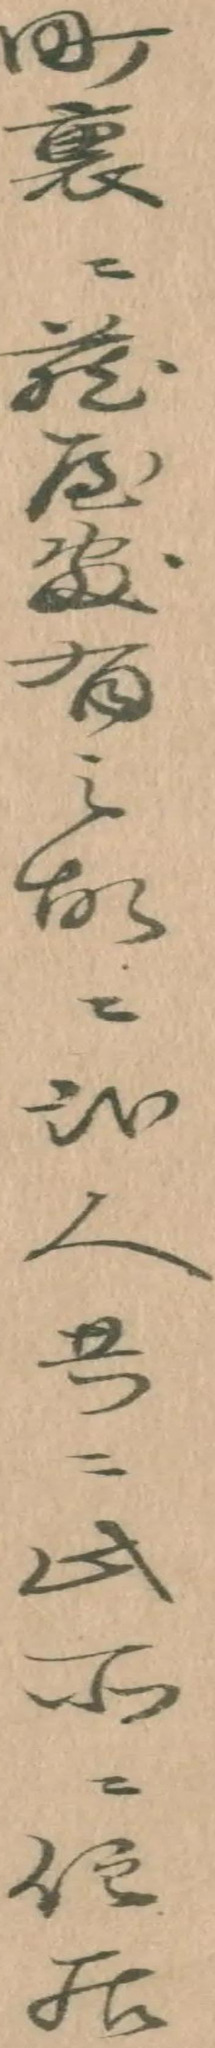町裏に蔵屋敷有之故に弐人共に此所に住居
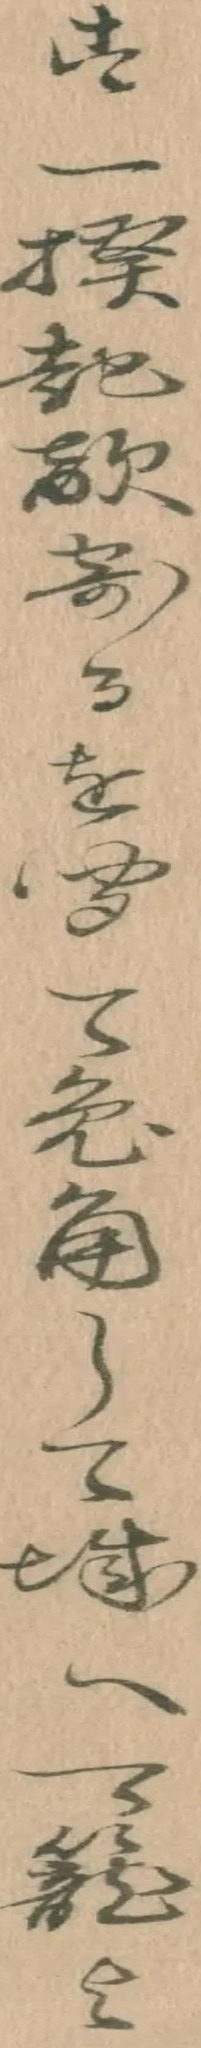す一揆起敵寄るを聞て兎角して城へ可籠与
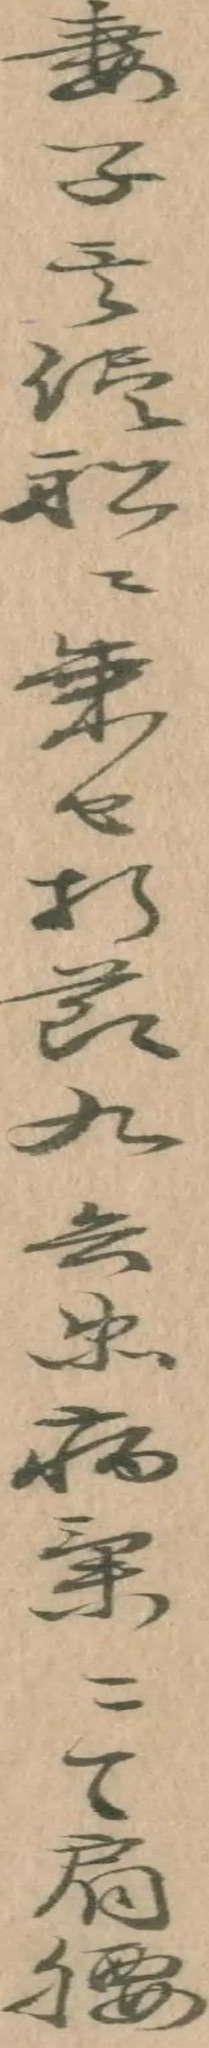妻子其侭船に乗せ折節九兵衛病気にて肩腰
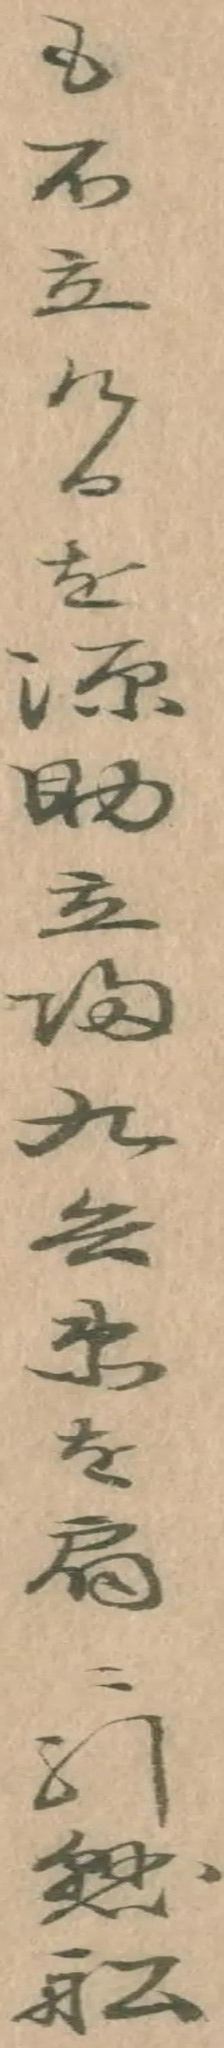も不立けるを源助立帰九兵衛を肩に引懸船
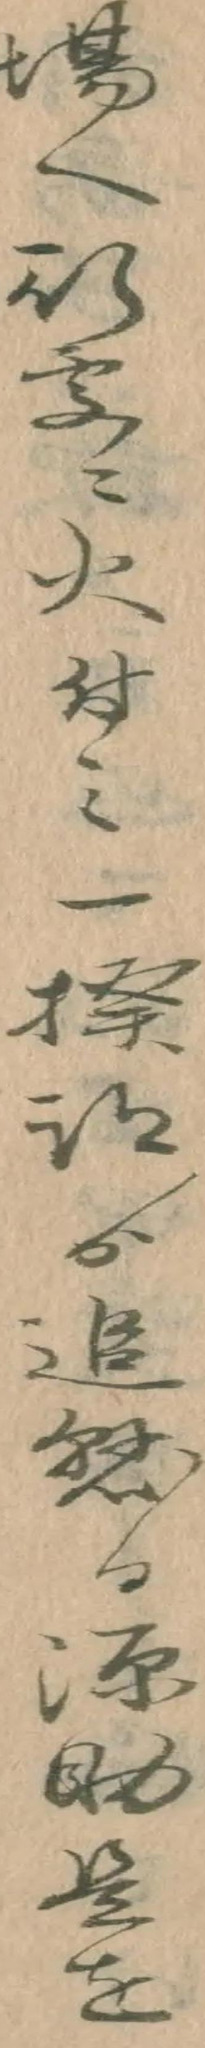場へ行処に火付之一揆跡ゟ追懸る源助是を
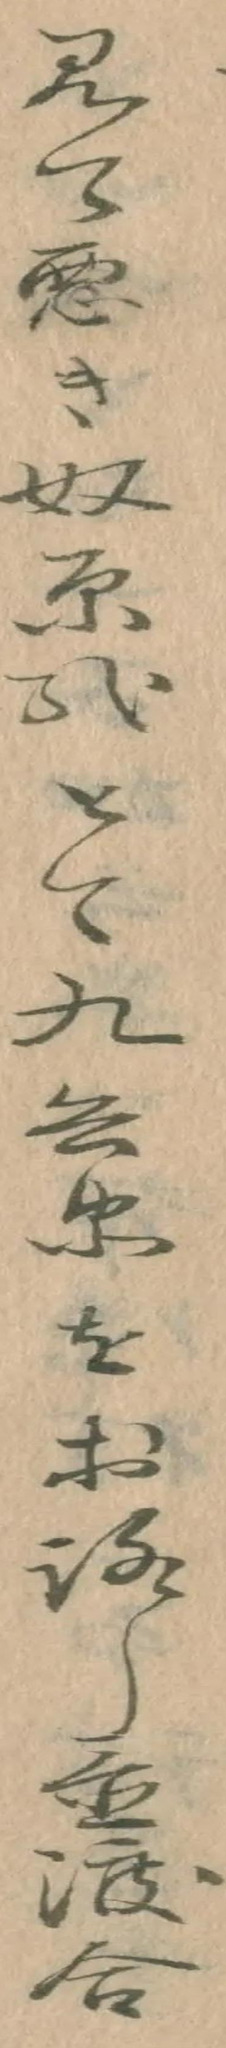見て悪き奴原哉とて九兵衛をおろし置渡合
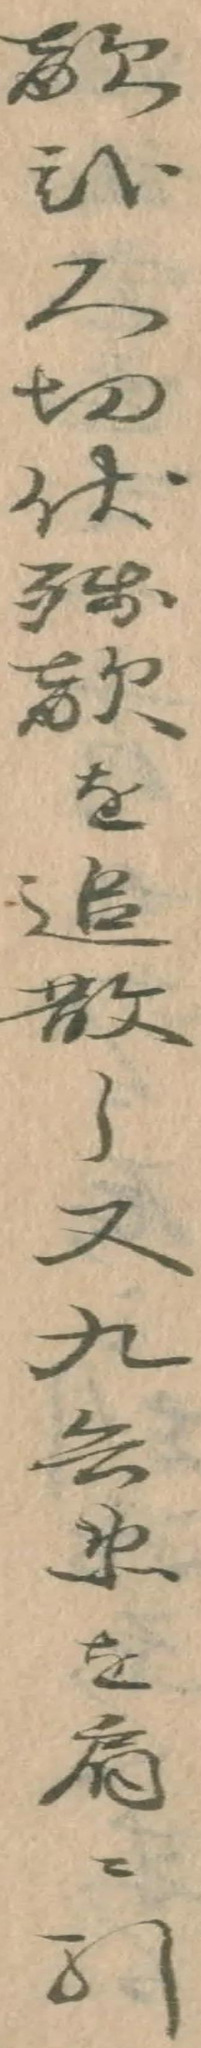敵弐人切伏残敵を追散し又九兵衛を肩に引
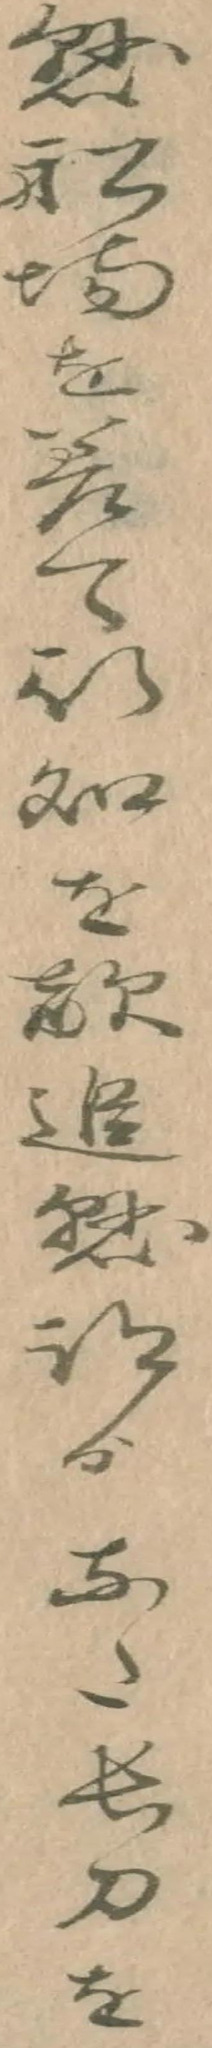懸船場を差て行処を敵追懸跡ゟなた長刀を
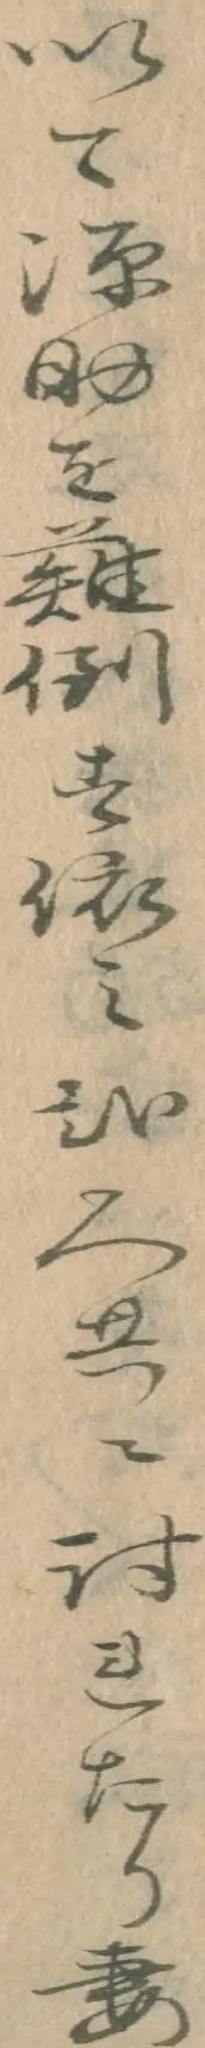以て源助を薙倒す依之弐人共に討れたり妻

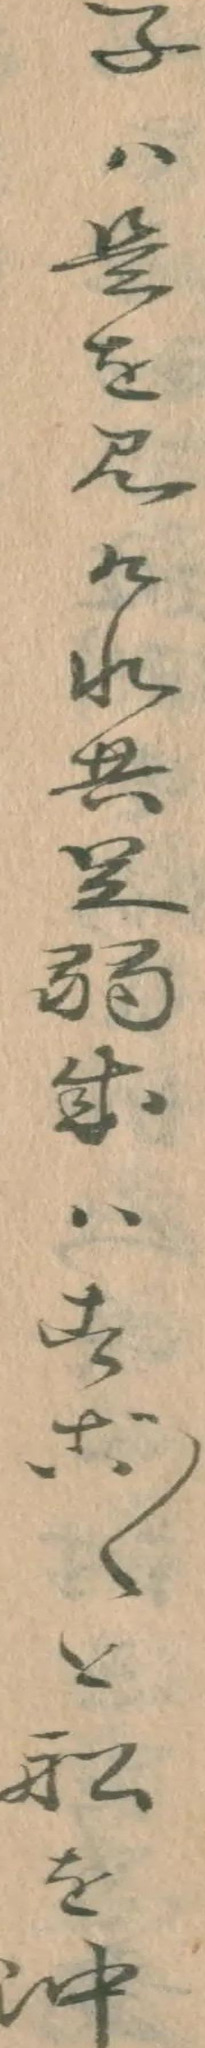子は是を見けれ共足弱成はすご〱と船を沖
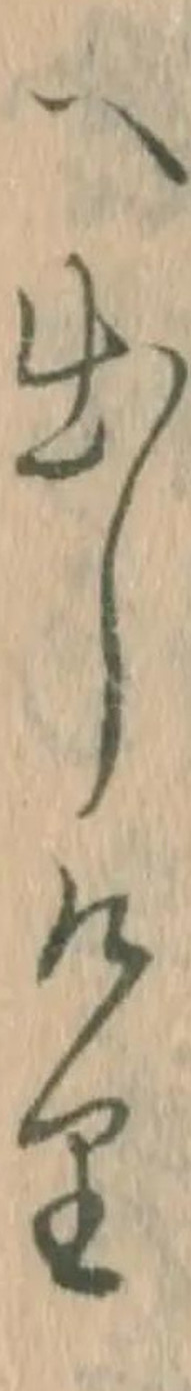へ出しけり
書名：切支丹御退治記 49巻. [1]
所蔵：国立国会図書館 National Diet Library, JAPAN
